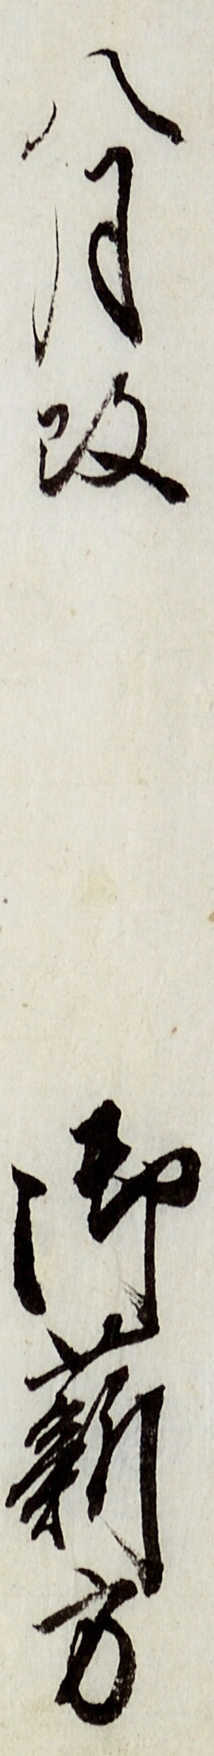八月改御薪方
